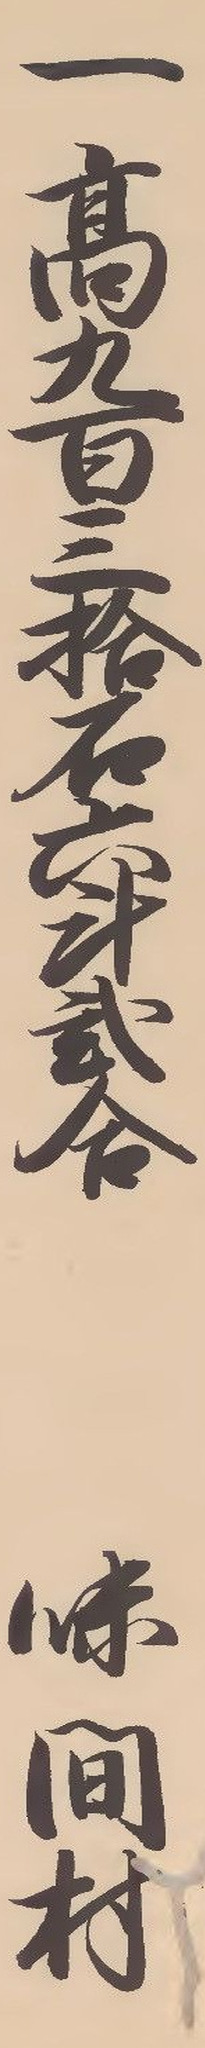一高九百三拾石六斗弐合味間村
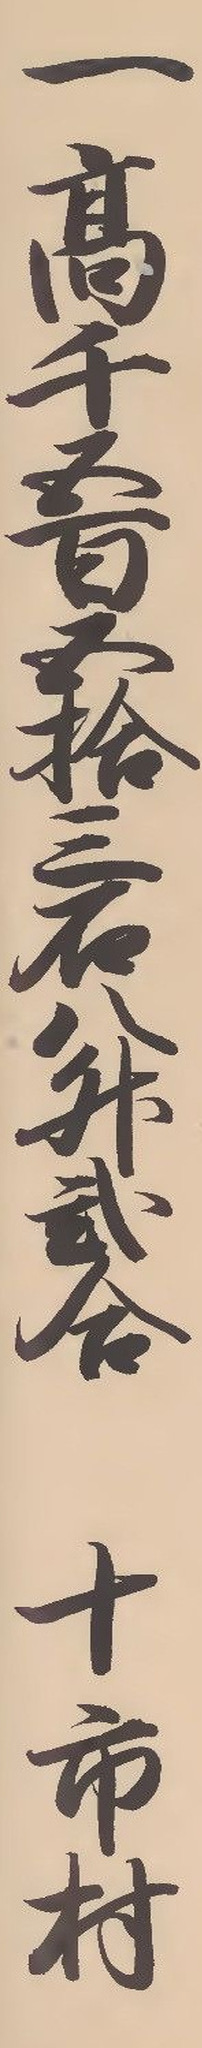一高千五百五拾三石八升弐合十市村
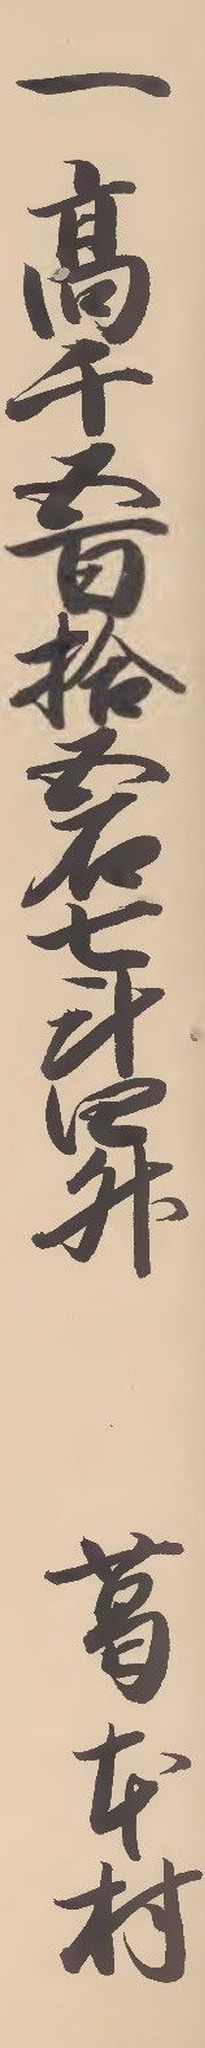一高千五百拾五石七斗四升葛本村
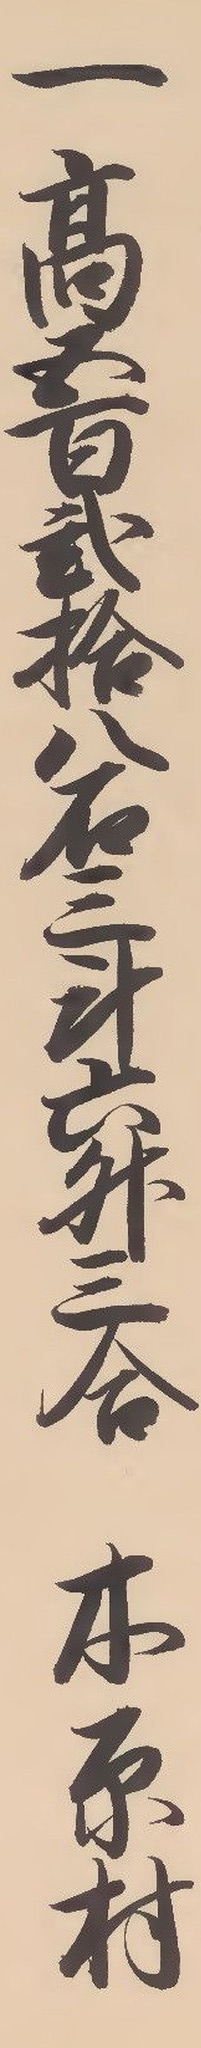一高五百弐拾八石三斗六升三合木原村
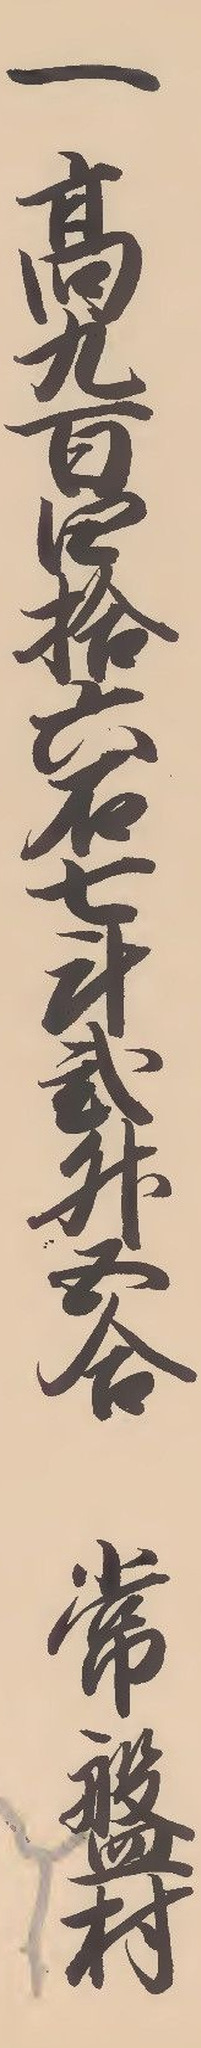一高九百四拾六石七斗弐升五合常盤村
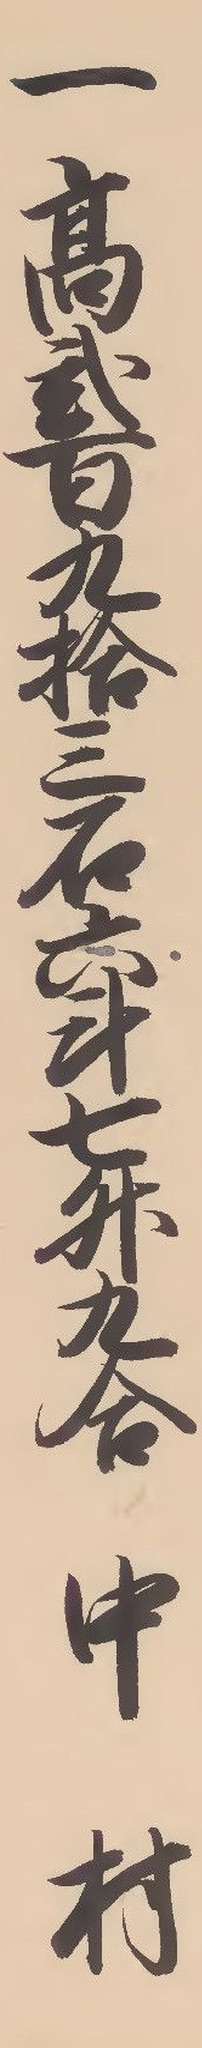一高弐百九拾三石六斗七升九合中村

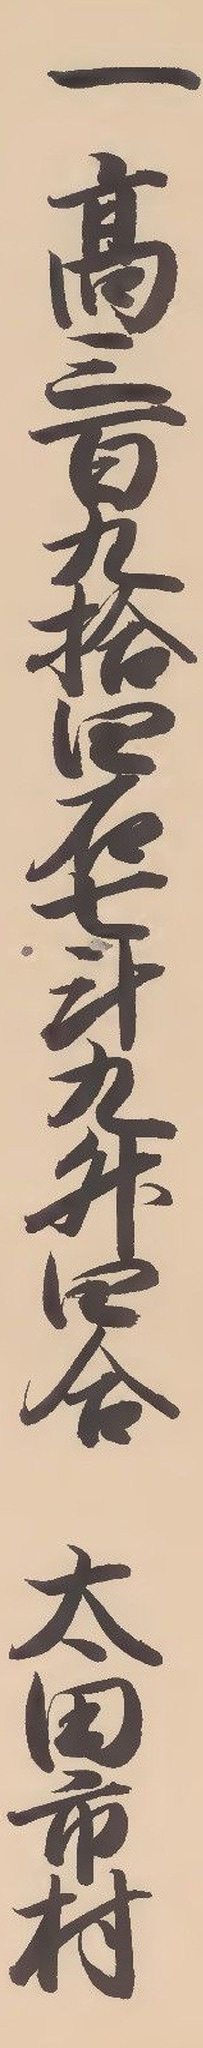一高三百九拾四石七斗九升四合太田市村
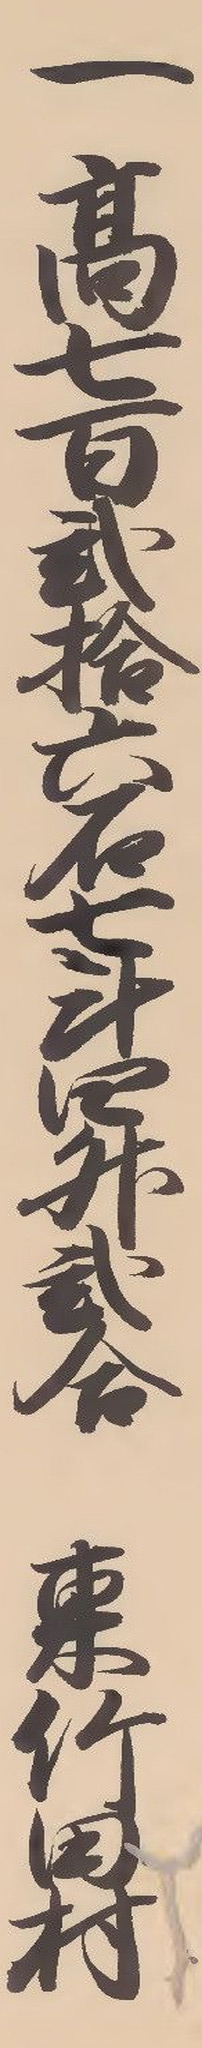一高七百弐拾六石七斗四升弐合東竹田村
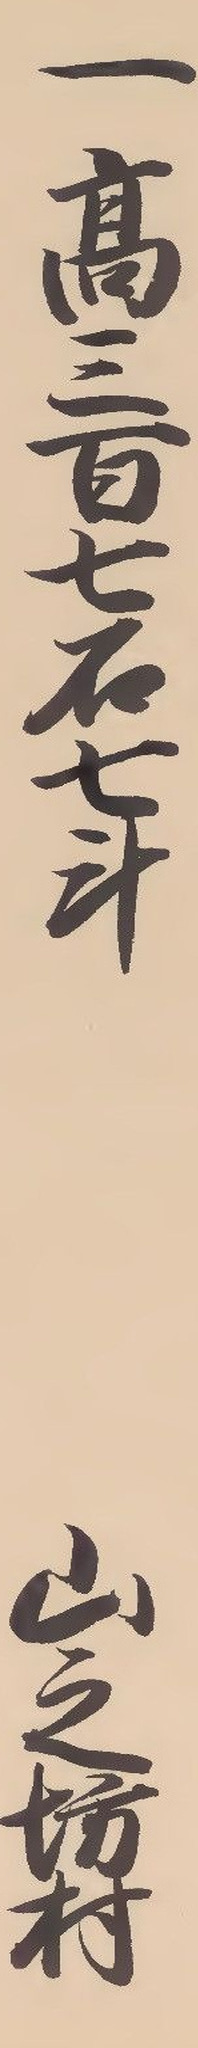一高三百七石七斗山之坊村
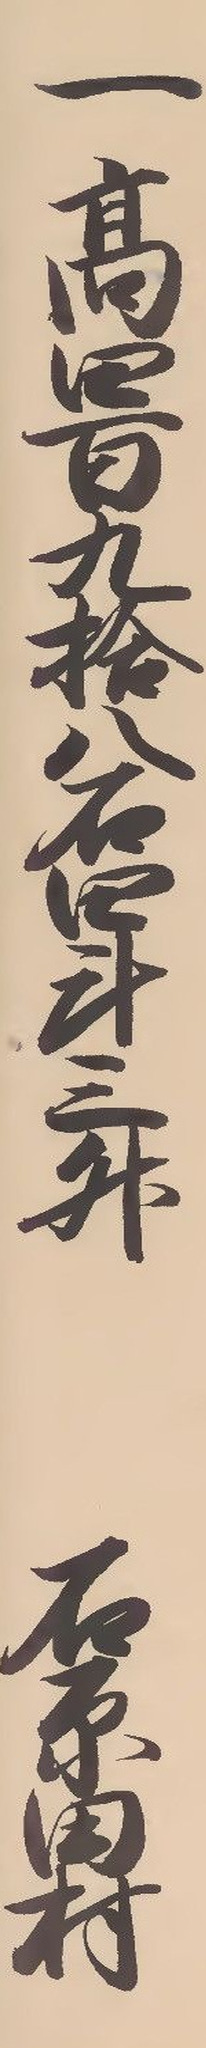一高四百九拾八石四斗三升石原田村
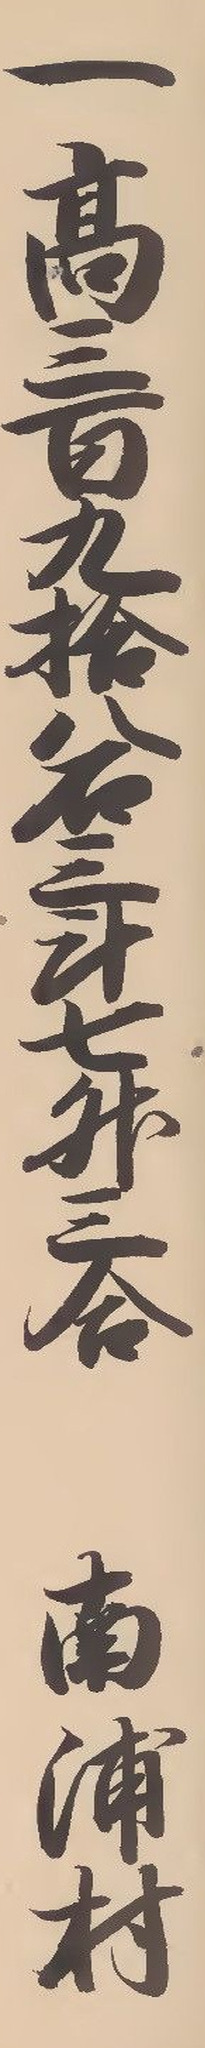一高三百九拾八石三斗七升三合南浦村
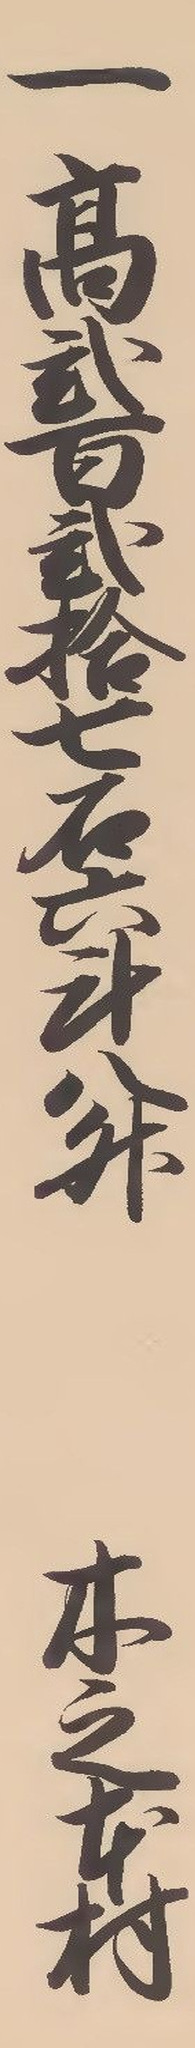一高弐百弐拾七石六斗八升木之本村
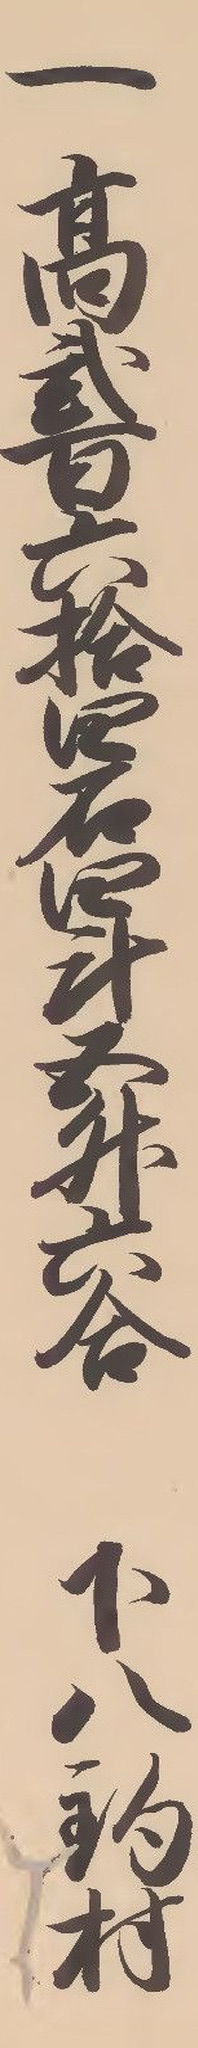一高弐百六拾四石四斗五升六合下八釣村
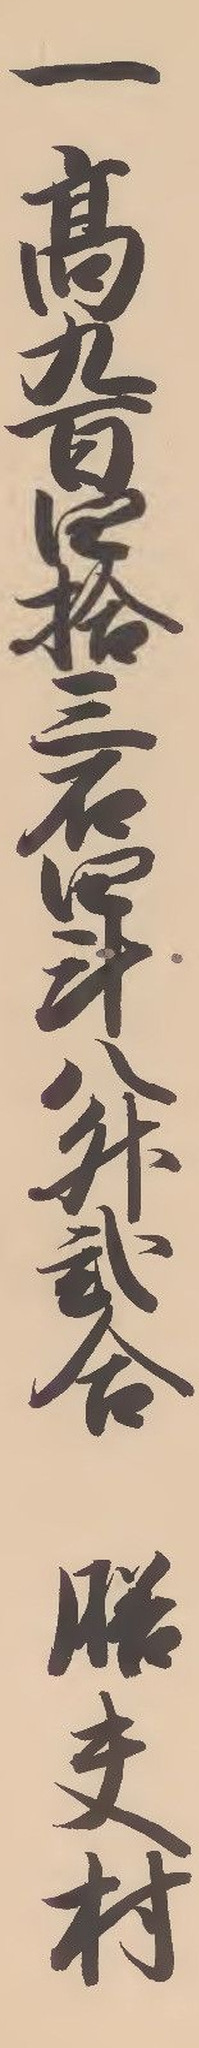一高九百四拾三石四斗八升弐合膳夫村

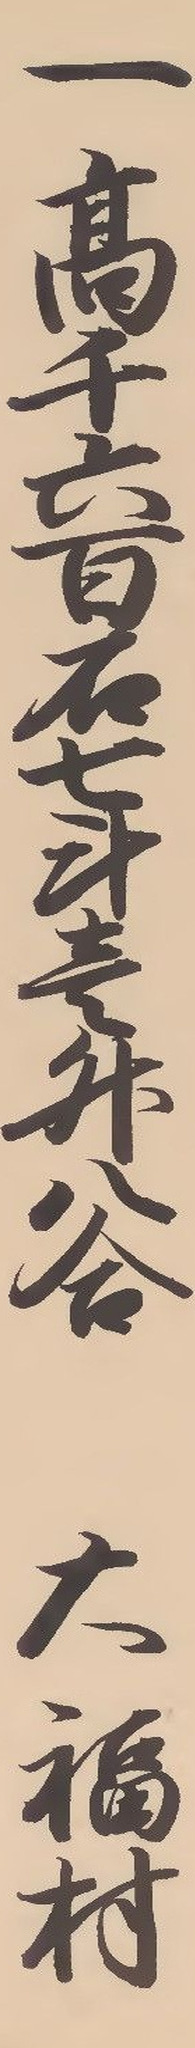一高千六百石七斗壱升八合大福村
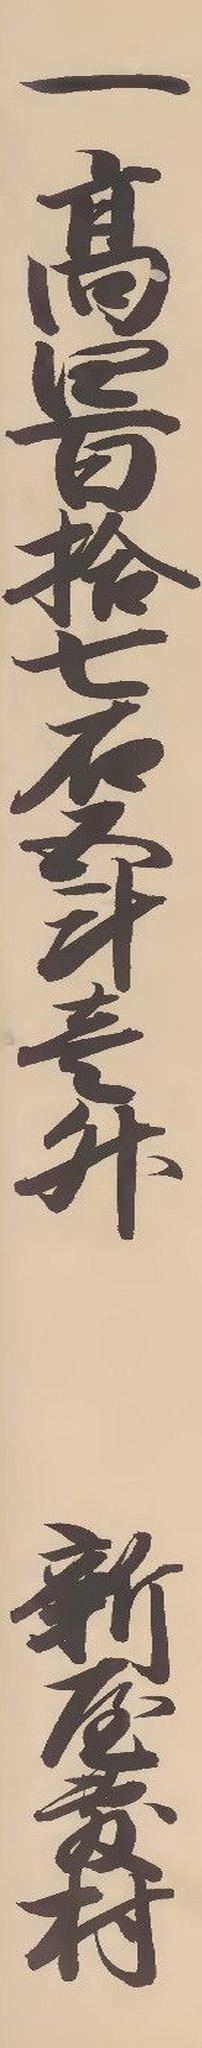一高四百拾七石五斗壱升新屋敷村
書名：大和国郷帳
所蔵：国立公文書館 National Archives of Japan
